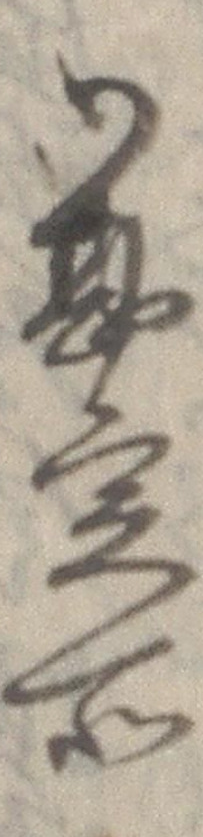御勘定所
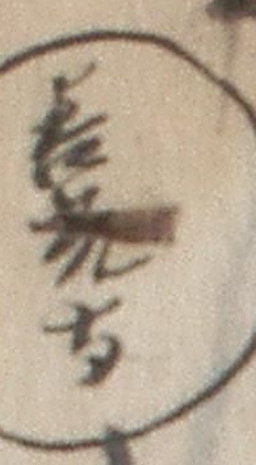善光寺

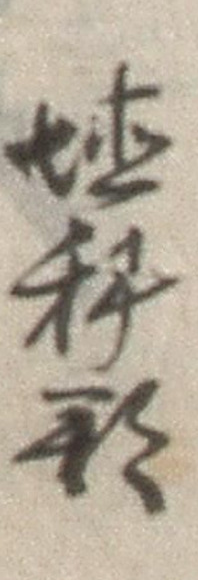埴科郡
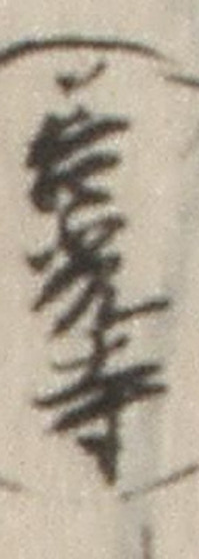善光寺
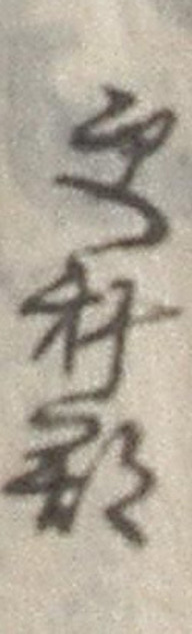埴科郡
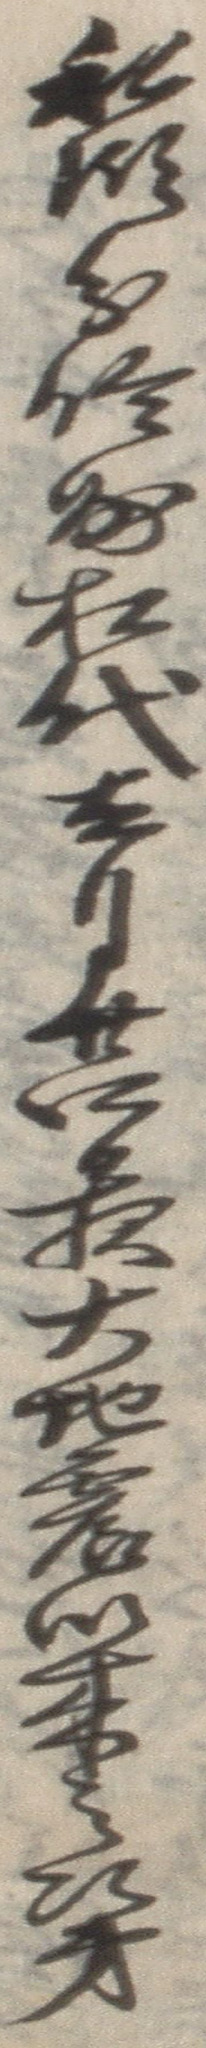私領分信州松代去月廿四日夜大地震以来之次第
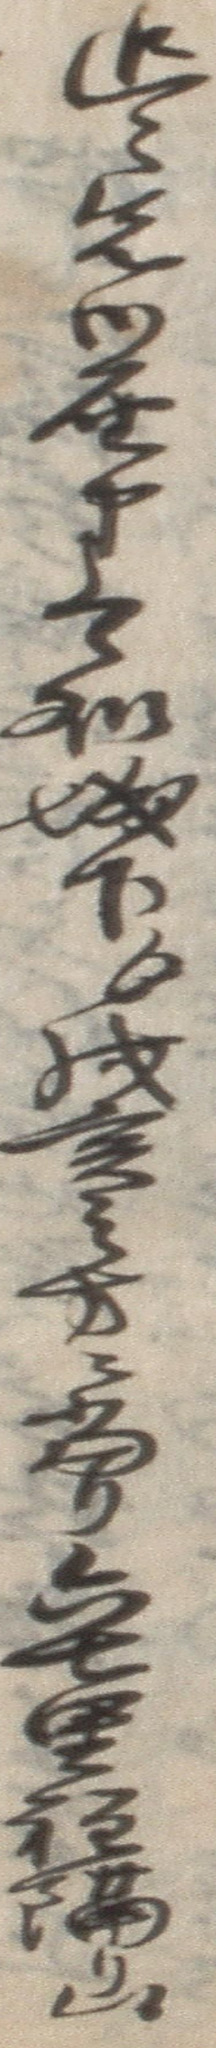追々先御届申上候処城下ゟ戌亥之方二当り六七里程隔り候
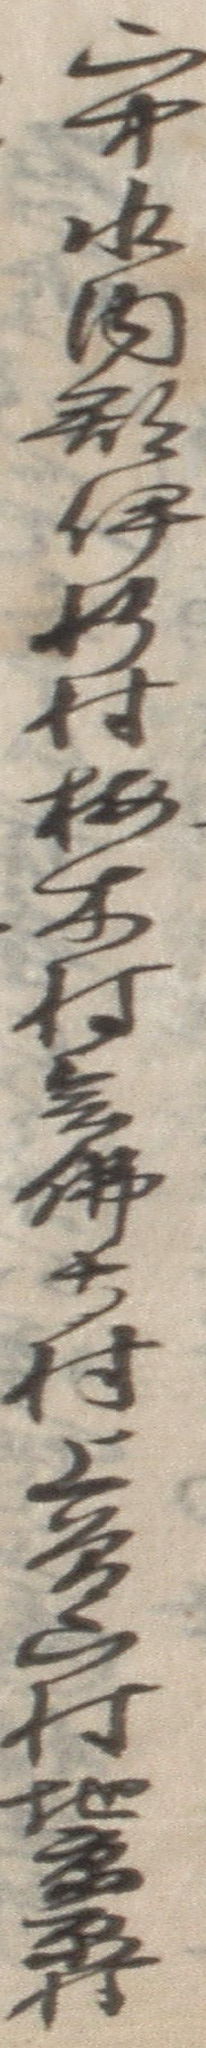山中水内郡伊折村梅木村念仏寺村上曾山村地亰ヶ原村
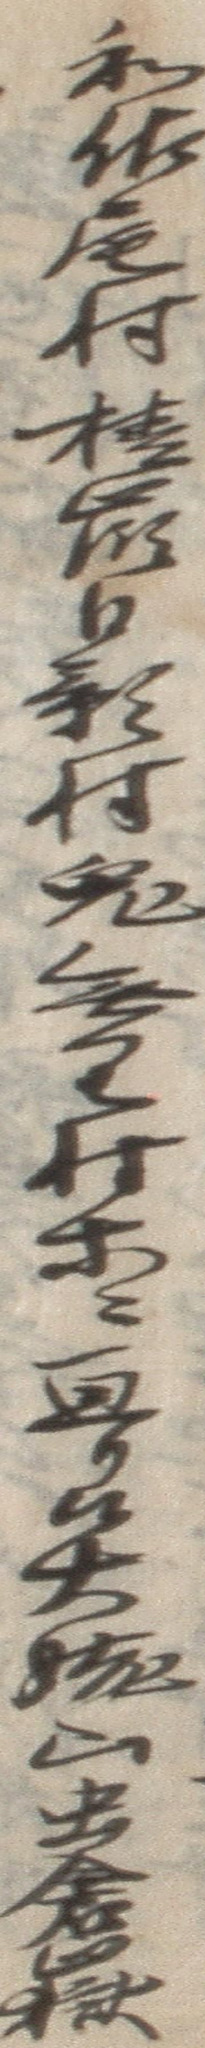和佐尾村椿嶺日影村鬼無里村等二亘り候大姥山虫倉嶽
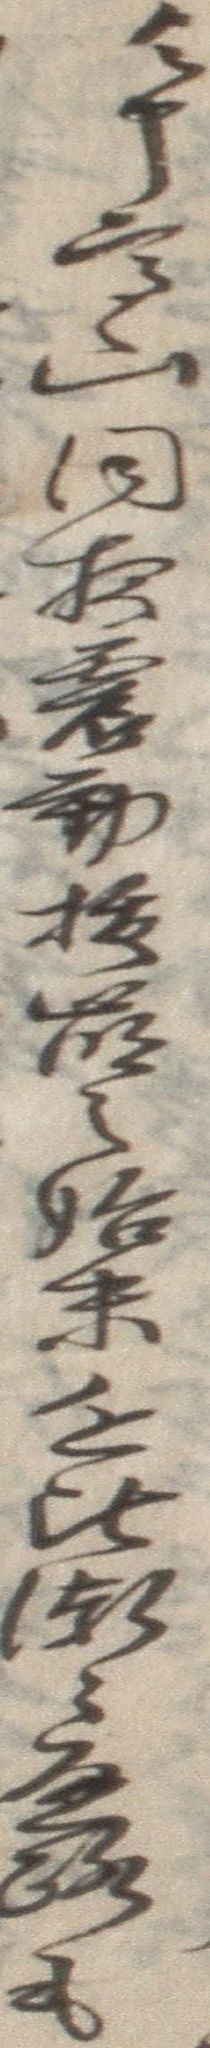と申高山同夜震動抜崩候始末近比漸々通路も
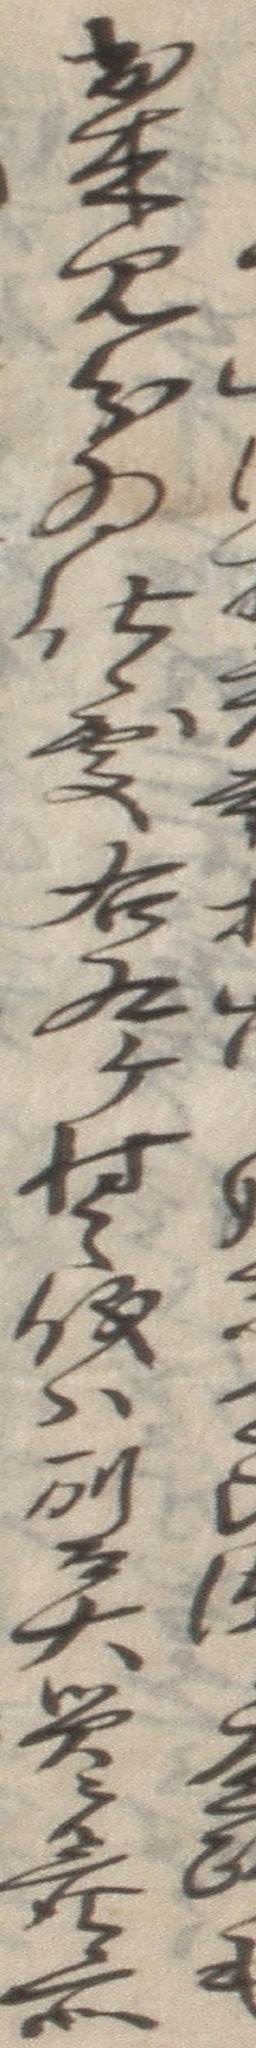出来見分為仕候処右九ヶ村之儀ハ別而大災二御座候所
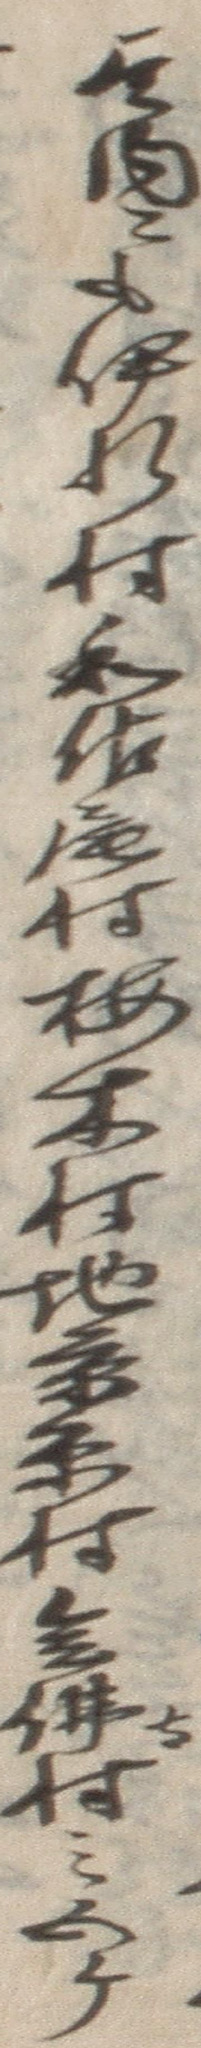其内にも伊折村和佐尾村梅木村地亰原村念仏寺村之五ヶ
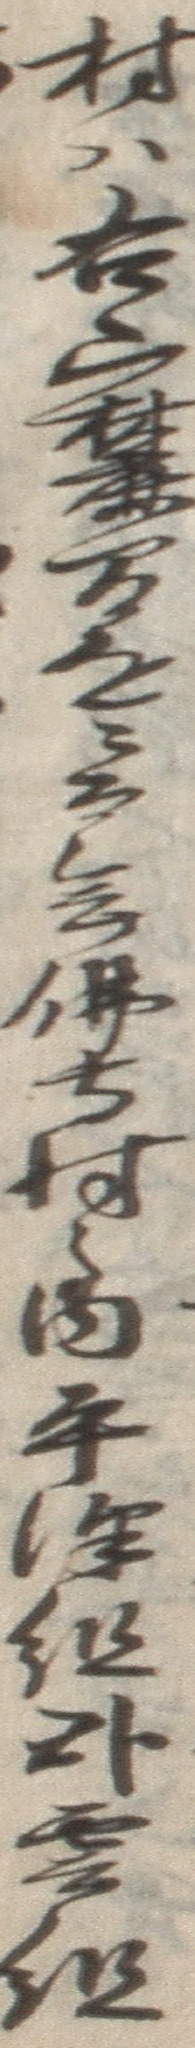村ハ右山麓間近二而念仏寺村之内平沢組臥雲組
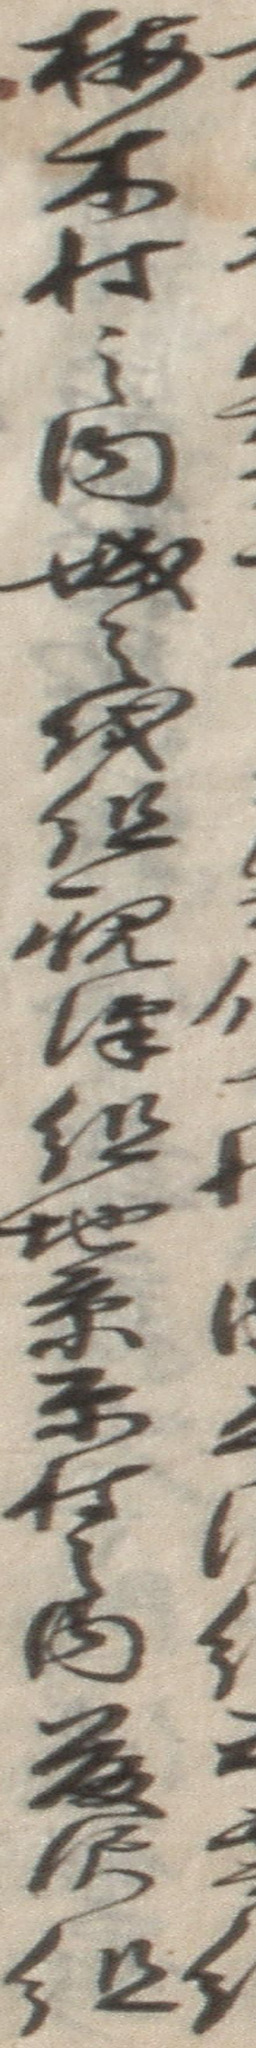梅木村之内城之越組親沢組地亰原村之内藤沢組
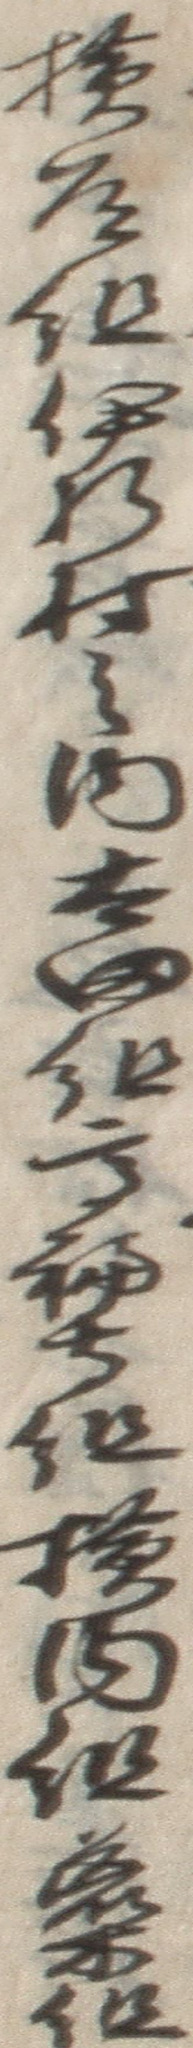横道組伊折村之内太田組高福寺組横内組荒木組
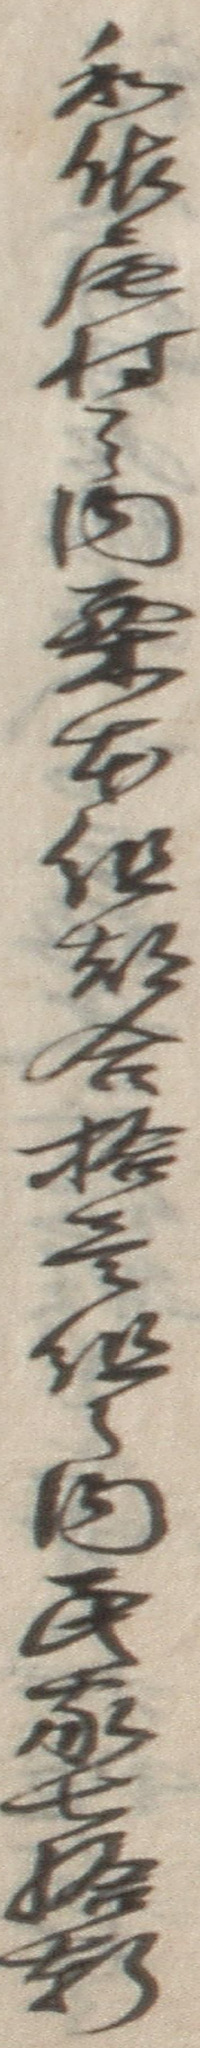和佐尾村之内栗本組都合拾壱組之内民家七拾軒
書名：信州地震一件
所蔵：東京大学地震研究所図書室 Earthquake Research Institute Library, The University of Tokyo, JAPAN
